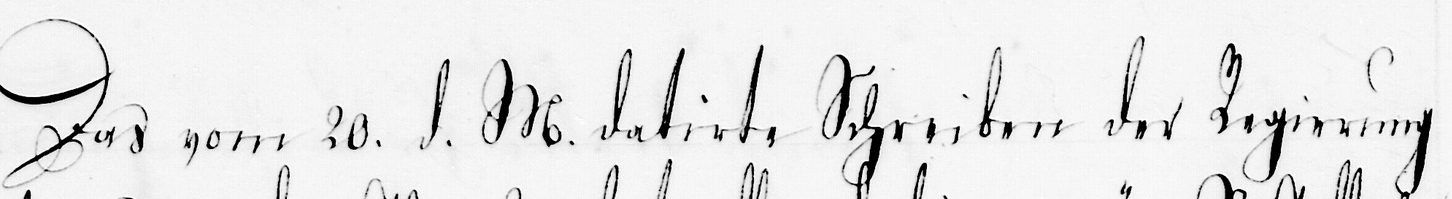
Das vom 20. d. M. datirte Schreiben der Regierung
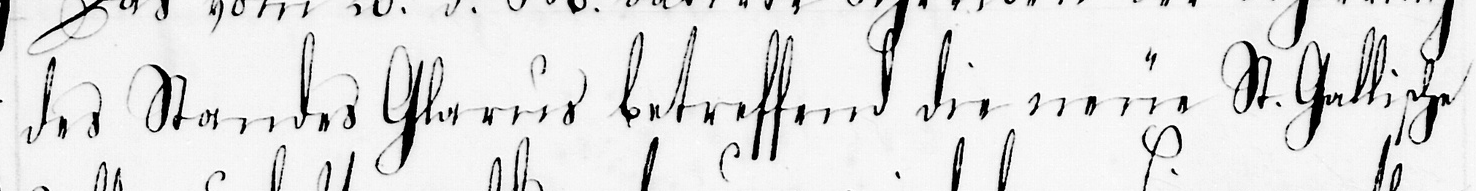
des Standes Glarus betreffend die neue St. Gallis¬
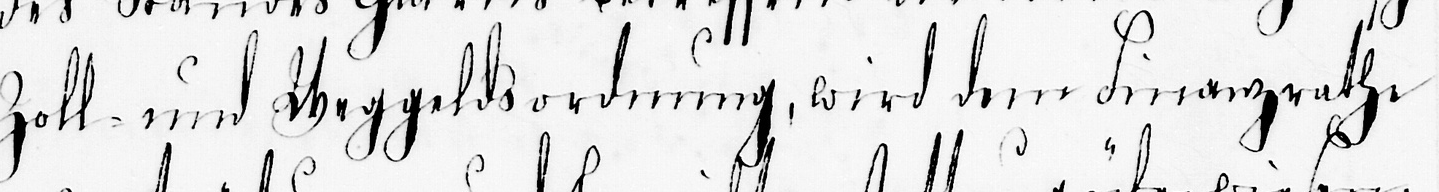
Zoll- und Weggeldsordnung, wird dem Finanzrathe
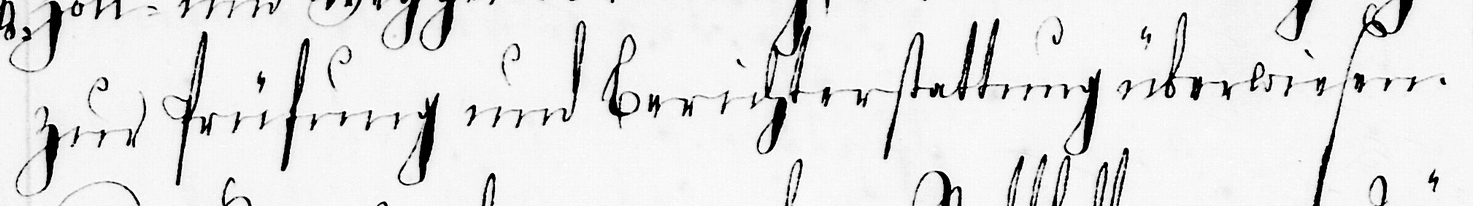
zur Prüfung und Berichterstattung überwiesen.
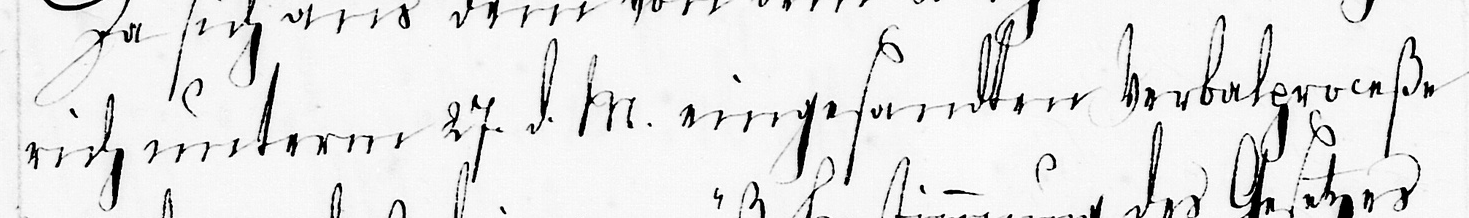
rich unterm 27. d. M. eingesandten Verbalproceße
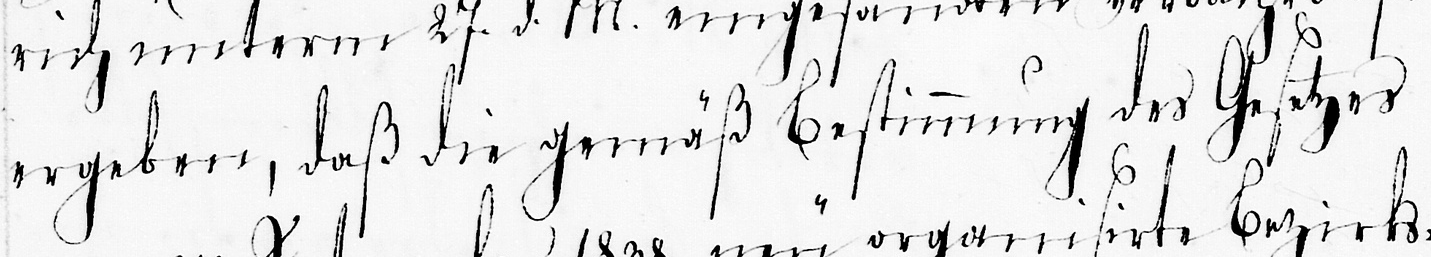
ergeben, daß die gemäß Bestimmung des Gesetzes
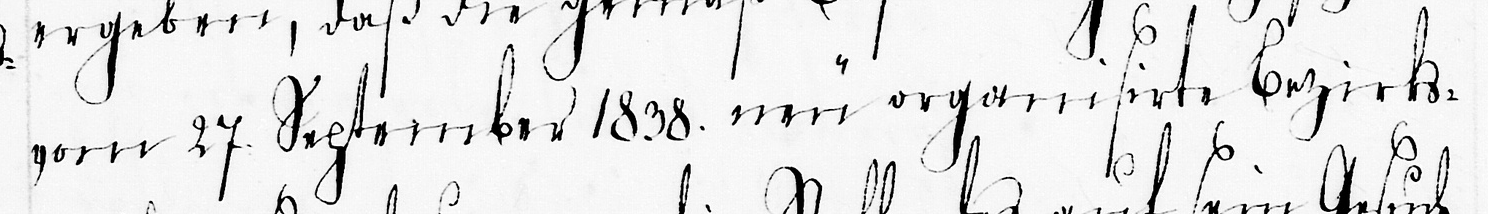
vom 27. September 1838. neu organisirte Bezirks¬
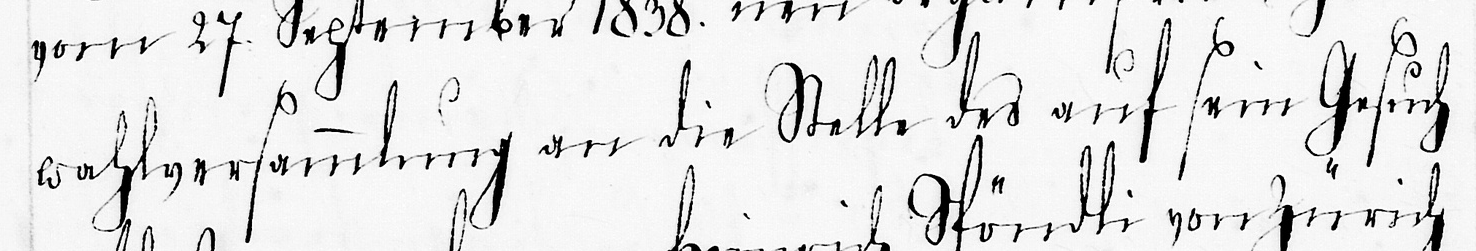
wahlversammlung an die Stelle des auf sein Gesuch
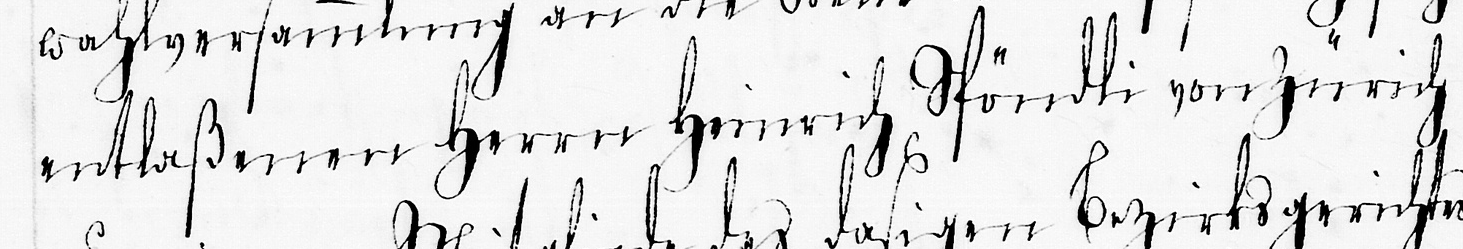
entlaßenen Herrn Heinrich Spöndli von Zürich
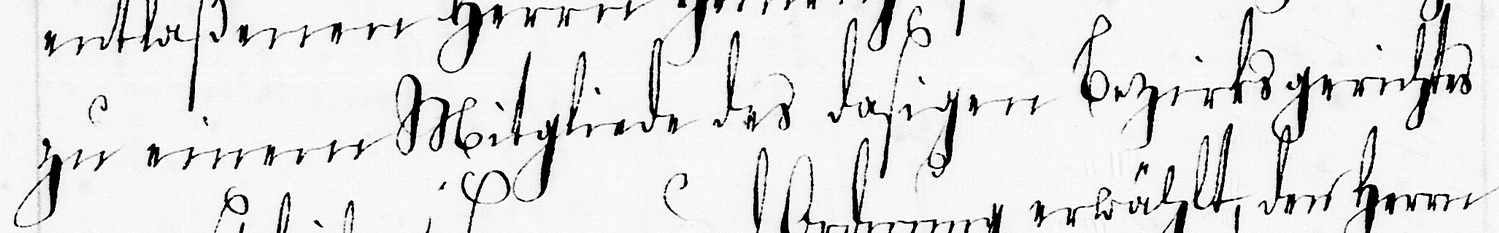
zu einem Mitgliede des dasigen Bezirksgerichtes
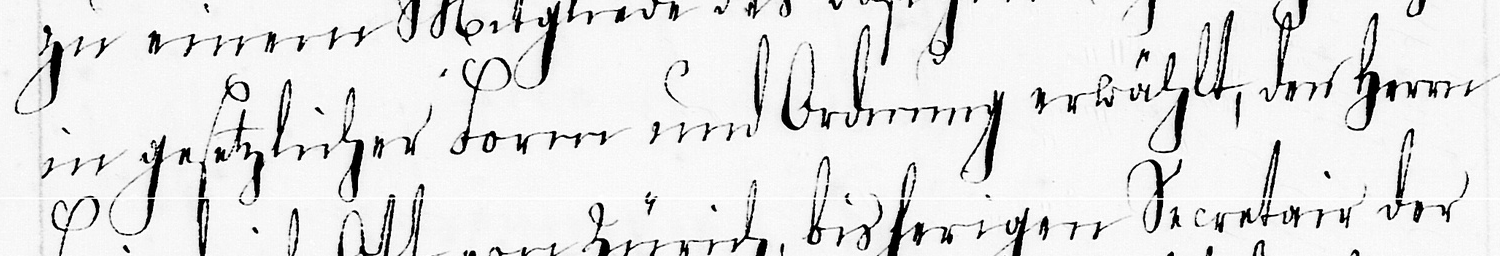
in gesetzlicher Form und Ordnung erwählt, den Herrn
